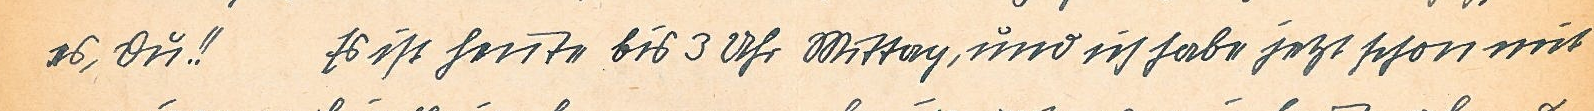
es, Du!! Es ist heute bis 3 Uhr Mittag, und ich habe jetzt schon mit
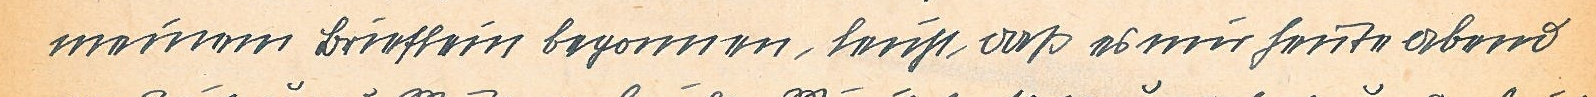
meinem Brieflein begonnen, leicht, daß es mir heute abend
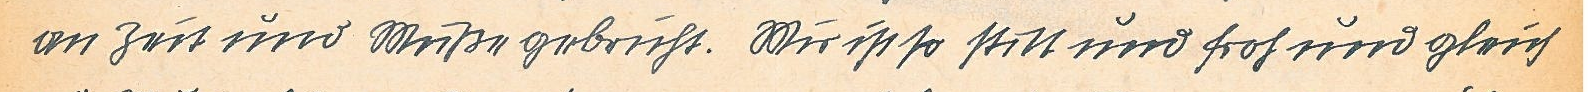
an Zeit und Muße gebricht. Mir ist so still und froh und gleich
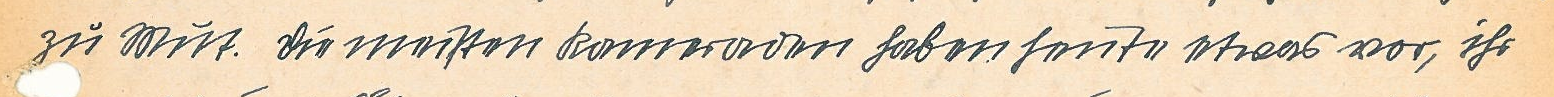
zu Mut. Die meisten Kameraden haben heute etwas vor, ihr
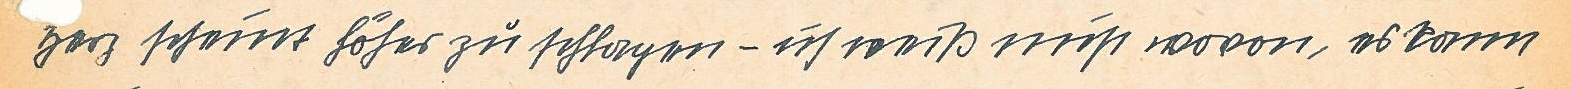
Herz scheint höher zu schlagen — ich weiß nicht wovon, es kann
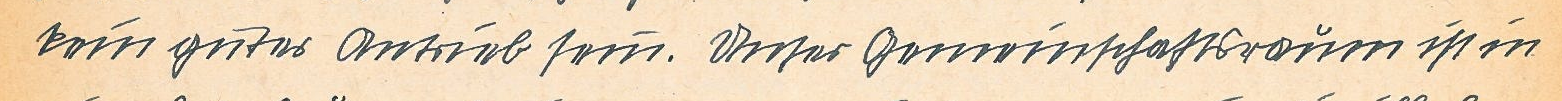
kein guter Antrieb sein. Unser Gemeinschaftsraum ist in
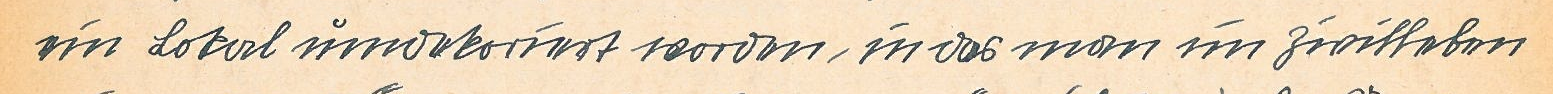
ein Lokal umdekoriert worden, in das man im Zivilleben
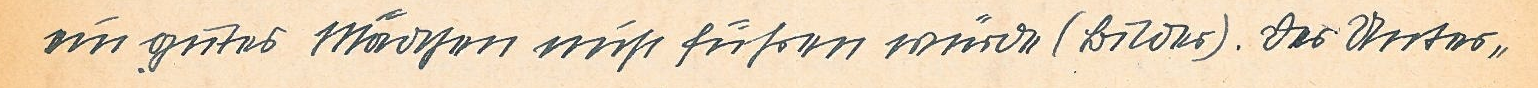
ein gutes Mädchen nicht führen würde (Bilder). Der Unter¬
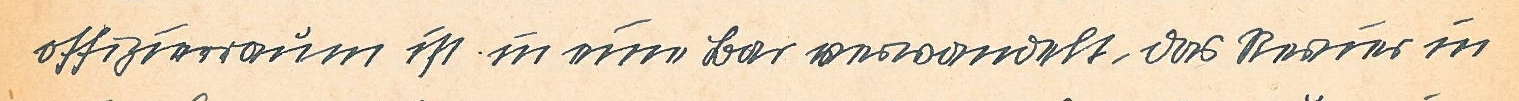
offizierraum ist in eine Bar verwandelt, das Revier in
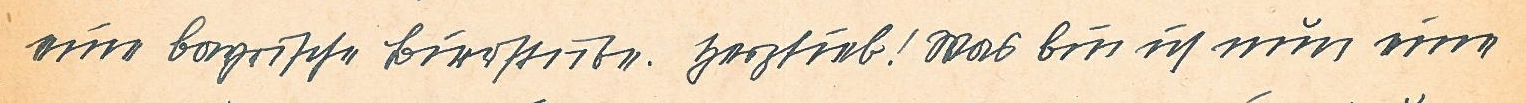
eine bayrische Bierstube. Herzlieb! Was bin ich nun für eine
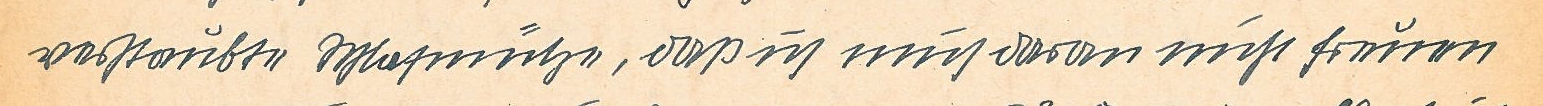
verstaubte Schlafmütze, daß ich mich daran nicht freuen
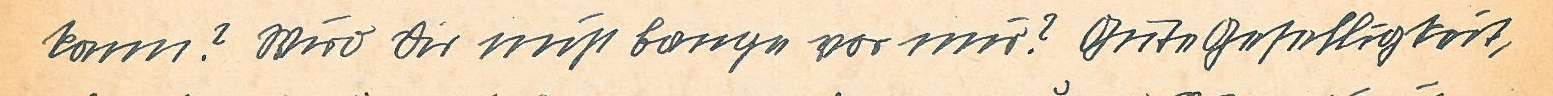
kann? Wird Dir nicht bange vor mir? Gute Geselligkeit,
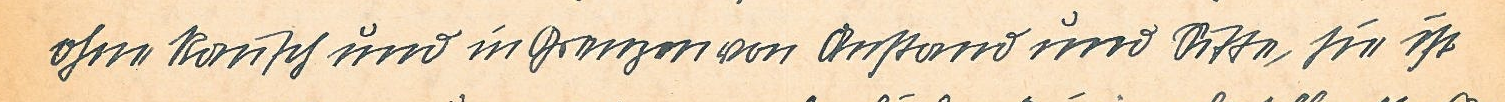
ohne Rausch und in Grenzen von Anstand und Sitte, sie ist
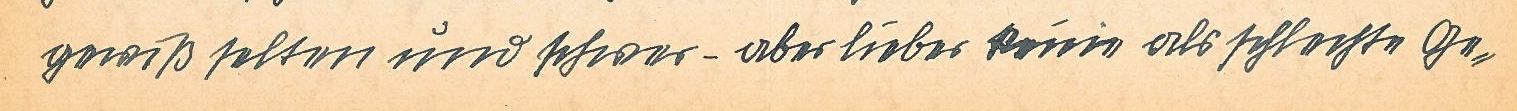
gewiß selten und schwer — aber lieber keine, als schlechte Ge¬
